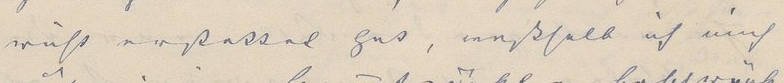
richt erstattet hat, weßhalb ich mich
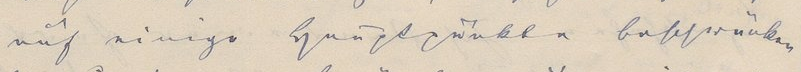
auf einige Hauptpunkte beschränken
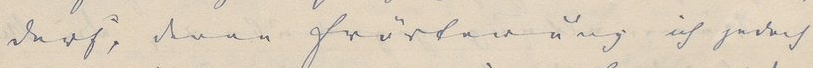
darf, deren Erörterung ich jedoch
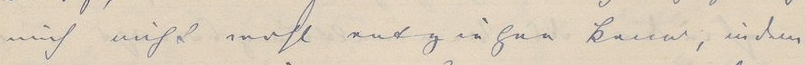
mich nicht wohl entziehen kann, indem
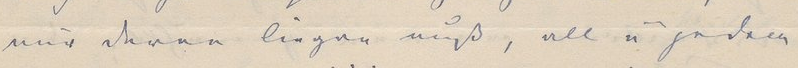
mir daran liegen muß, all u jedem
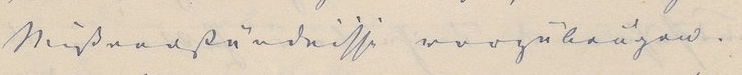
Mißverständnisse vorzubeugen.
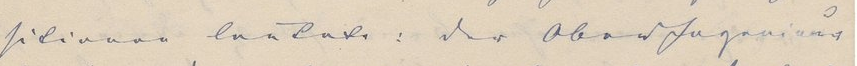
sitionen lautete: «Der OberIngenieur
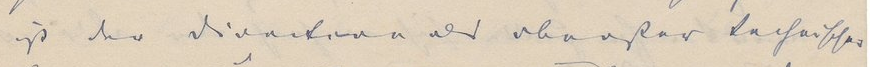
ist der Direction als oberster technischer
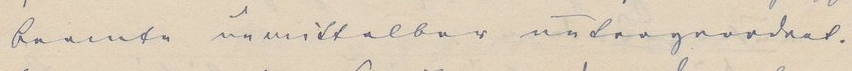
Beamte unmittelbar untergeordnet.
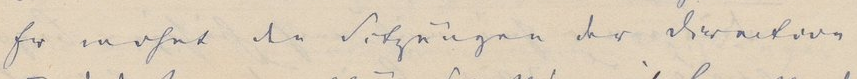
Er wohnt den Sitzungen der Direction
